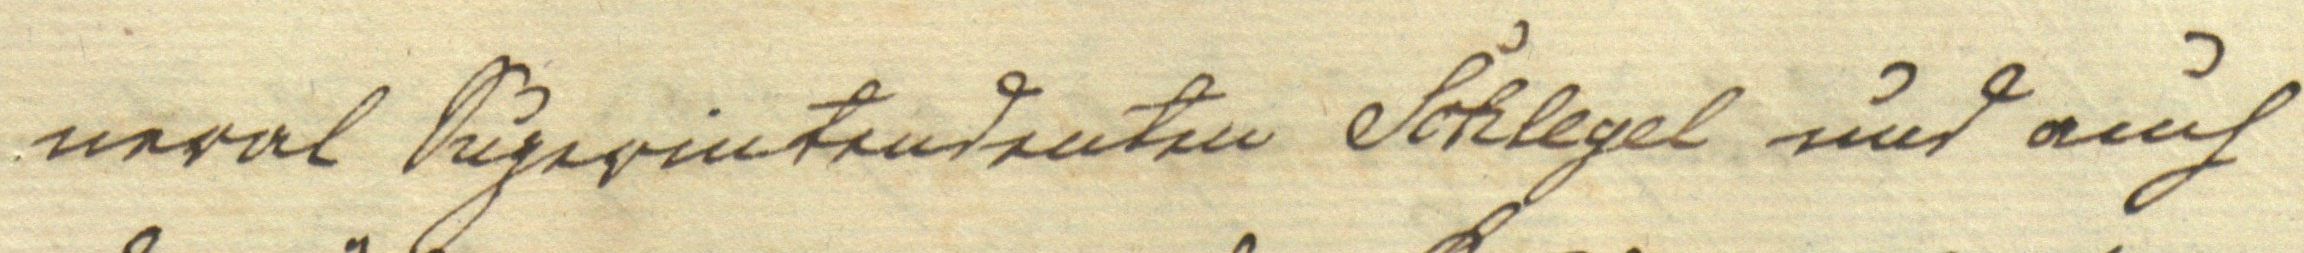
neral Superintendenten Schlegel und auch
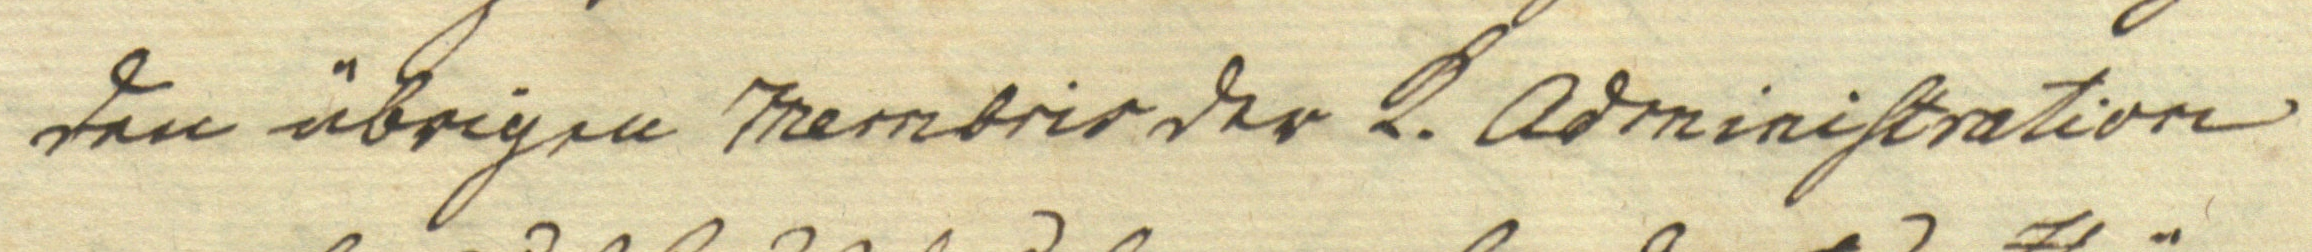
den übrigen Membris der K. Administration
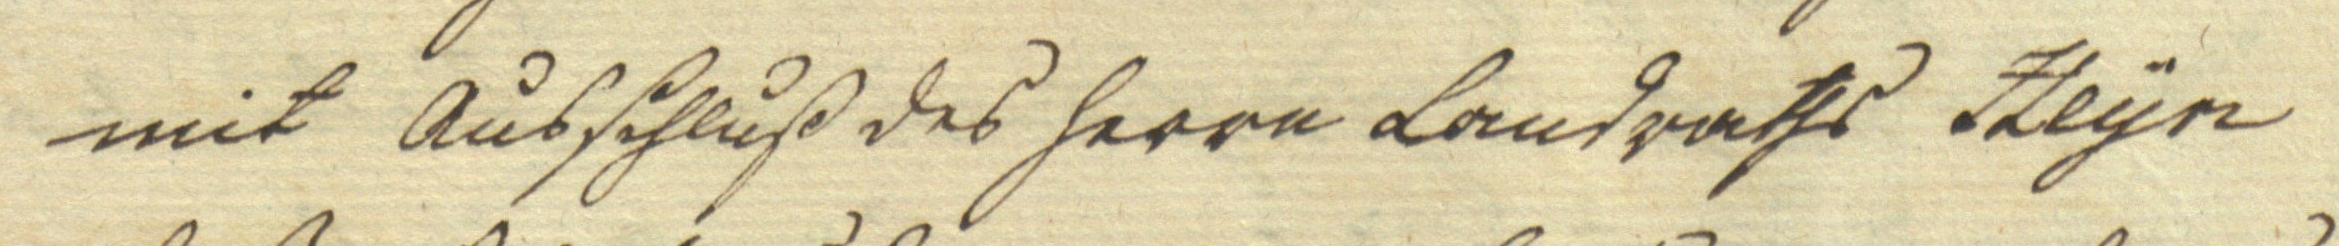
mit Ausschluß des Herrn Landraths Heÿn
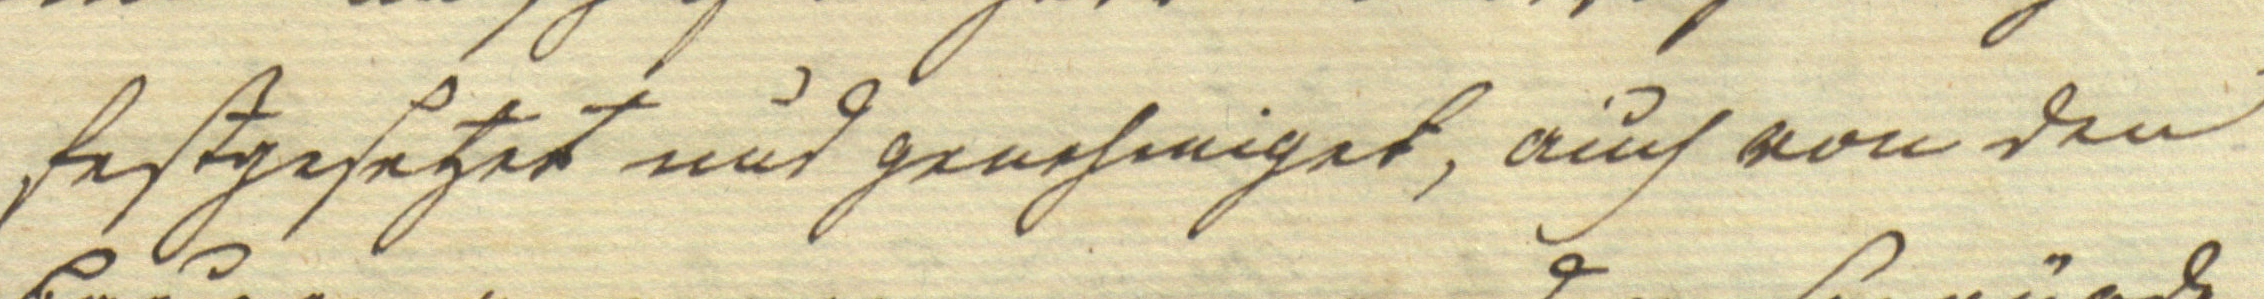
festgesetzet und genehmiget, auch von den
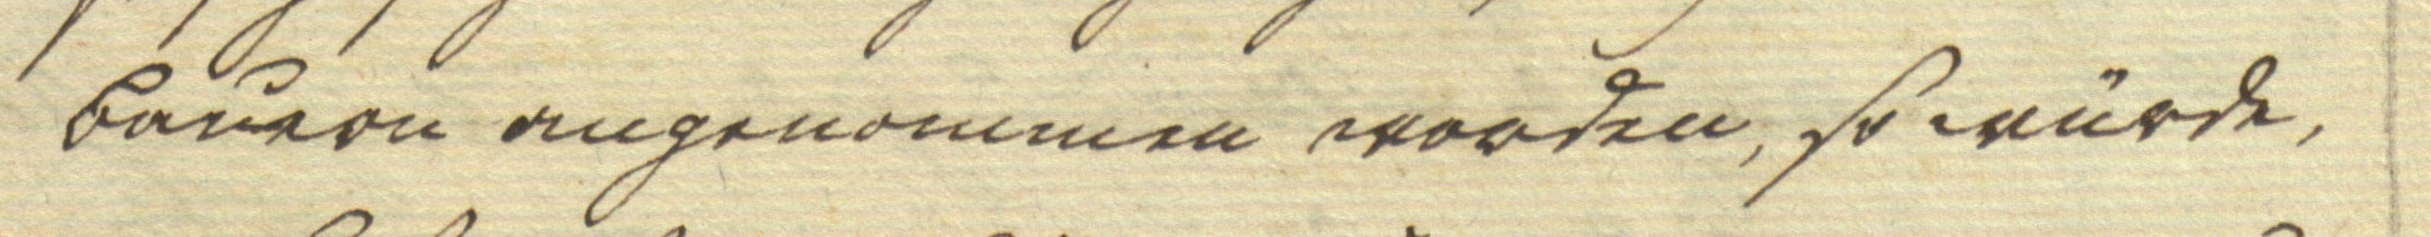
Bauern angenommen worden, so würde,
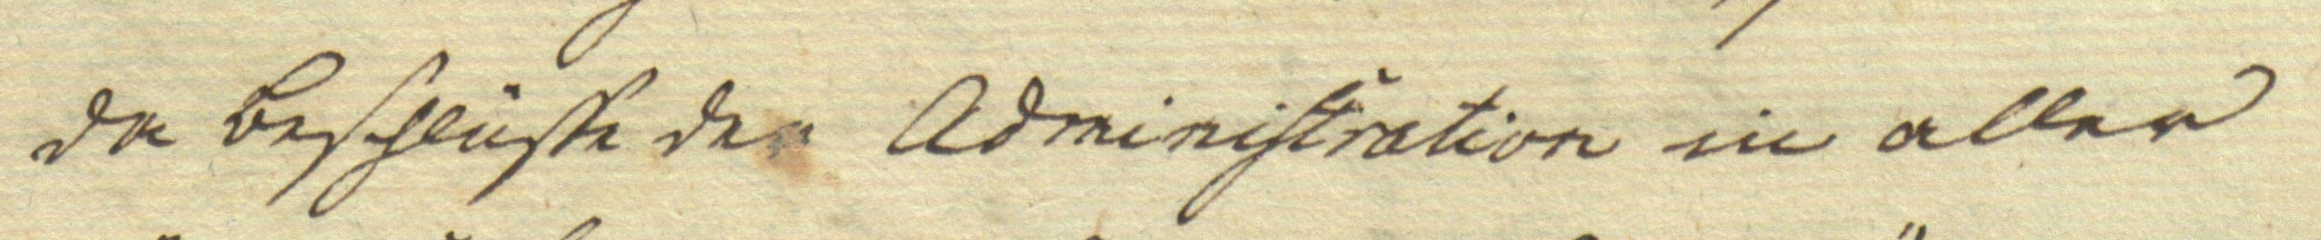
da Beschlüste der Administration in aller
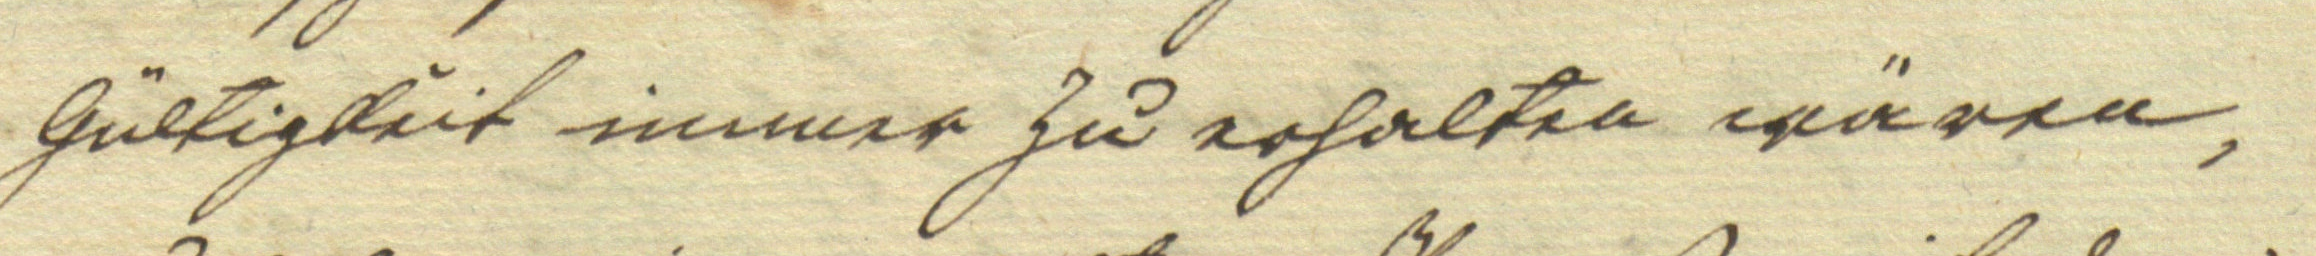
Gültigkeit immer zu erhalten wären,
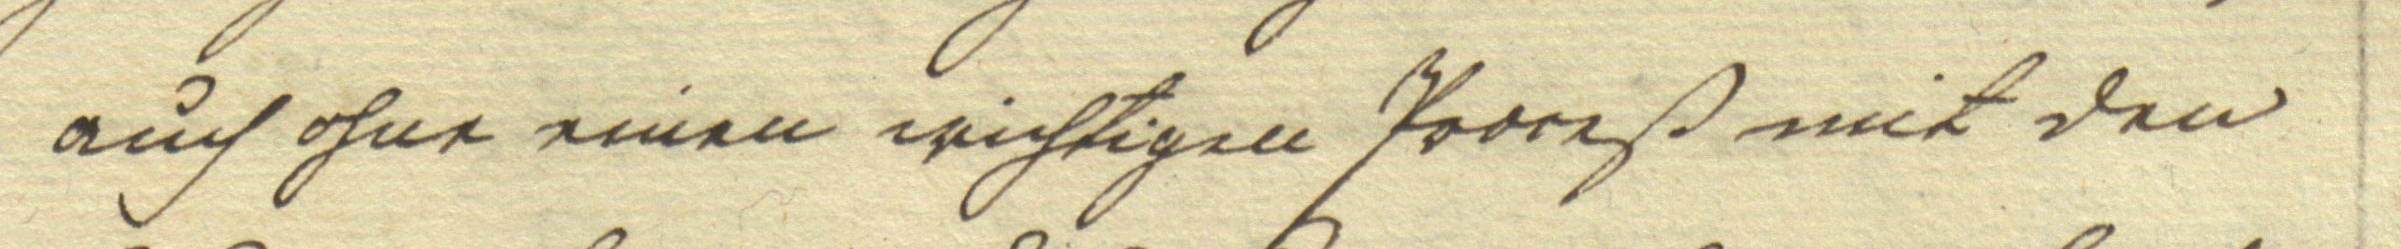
auch ohne einen wichtigen Proceß mit den
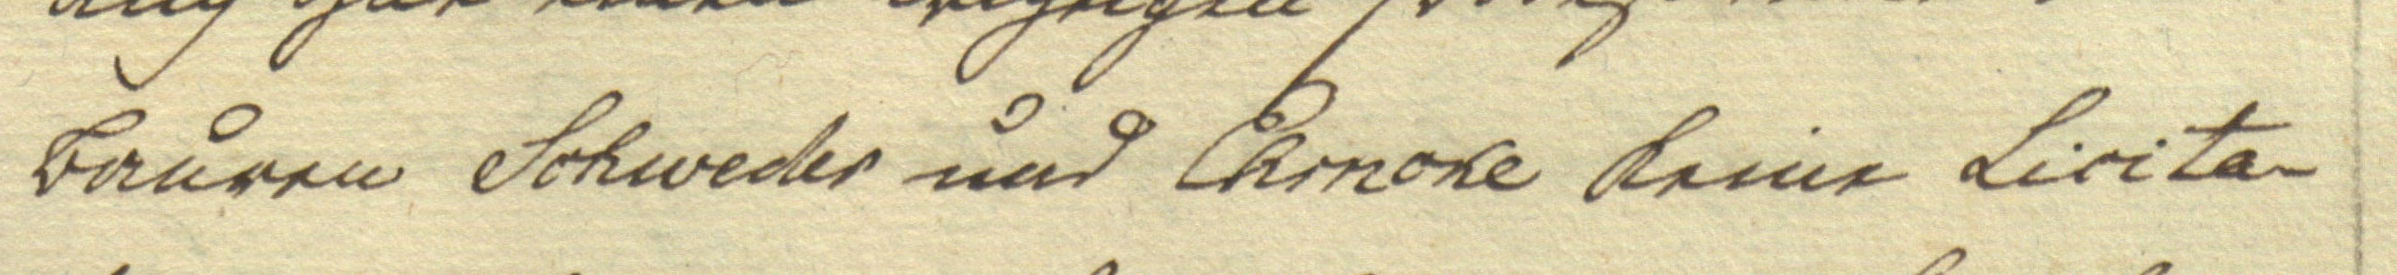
Bauren Schweder und Ehmcke keine Licita¬
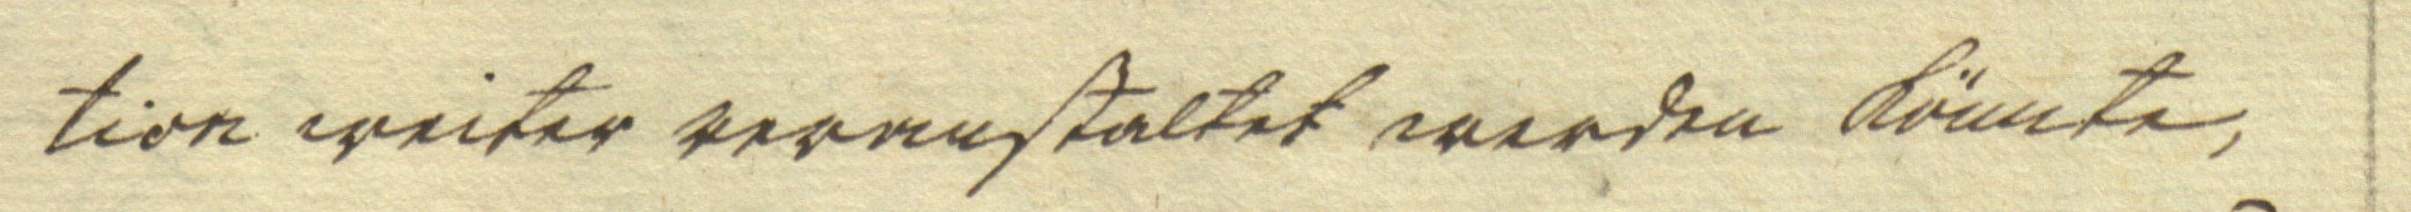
tion weiter veranstaltet werden könnte,
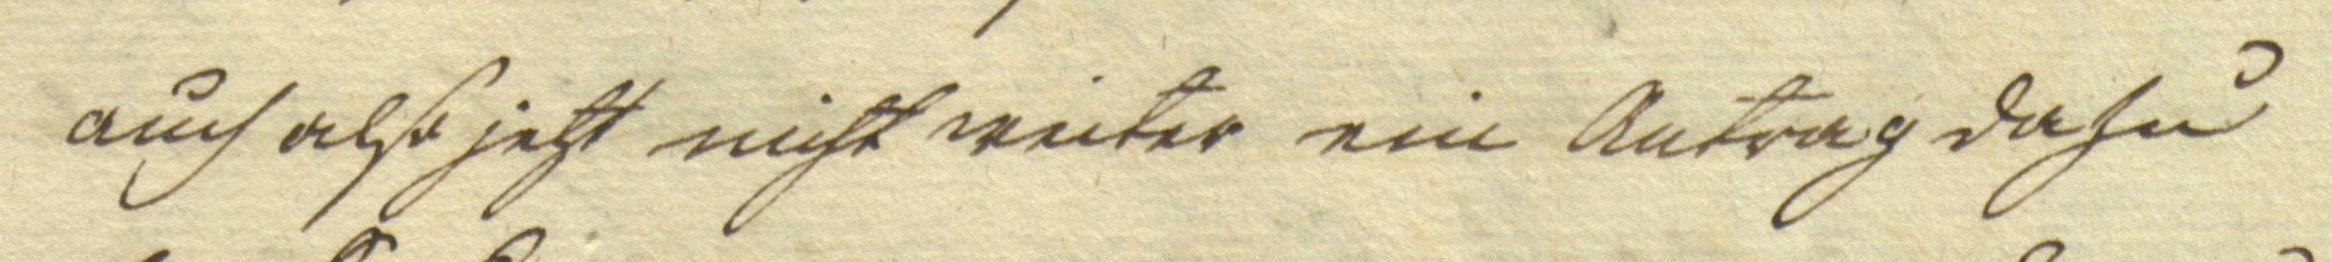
auch als jetzt nicht weiter ein Antrag dahin
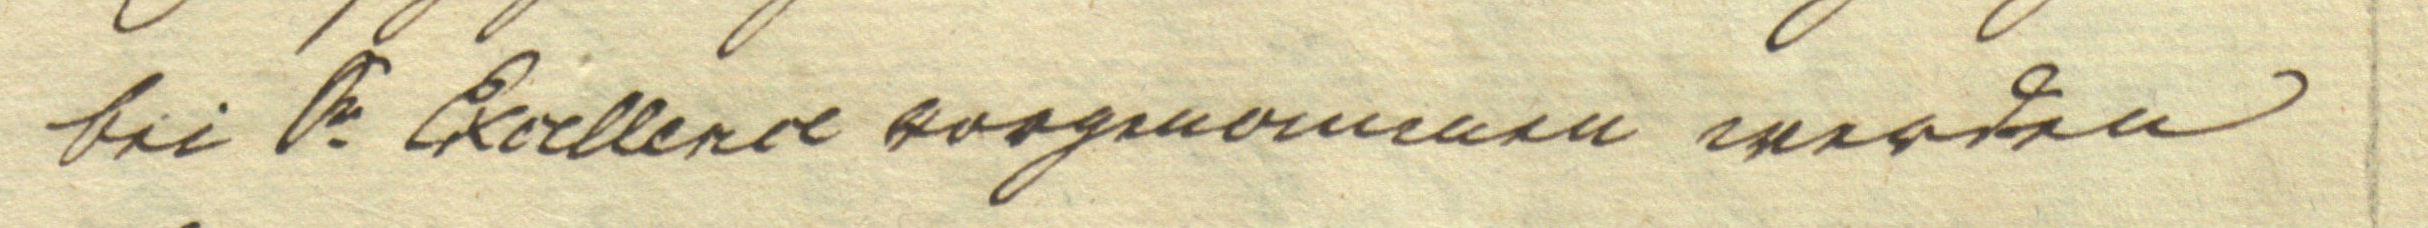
bei Sr Excellence vorgenommen werden
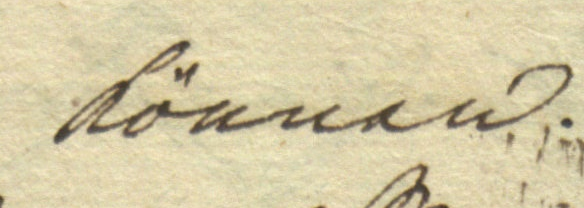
können.
